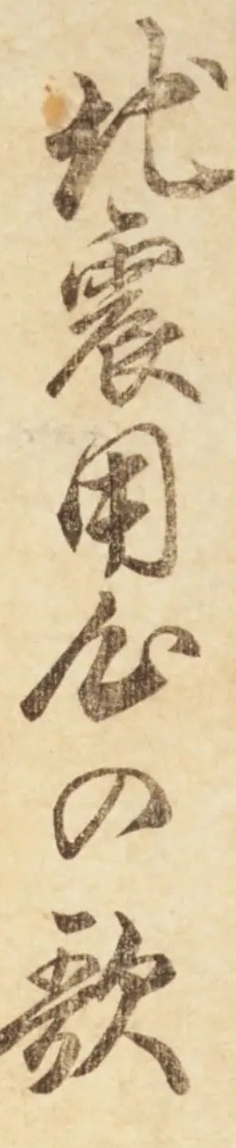地震用心の歌
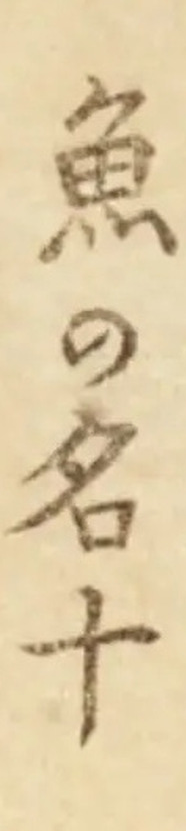魚の名十
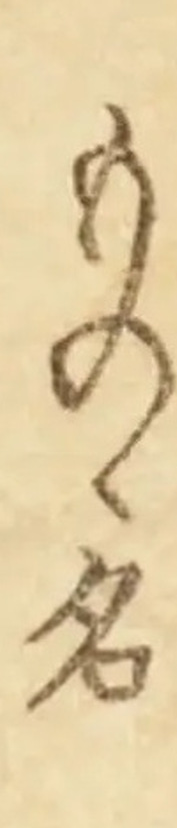ものゝ名
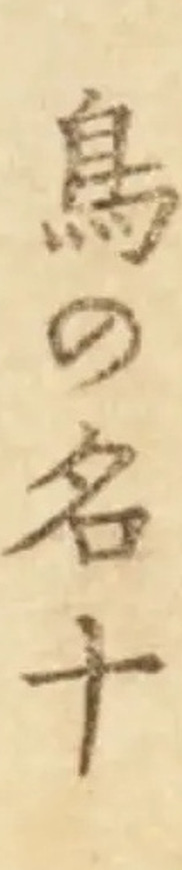鳥の名十
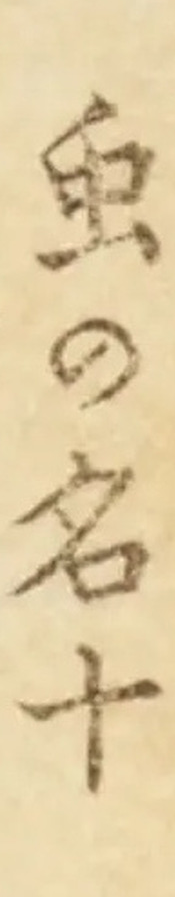虫の名十
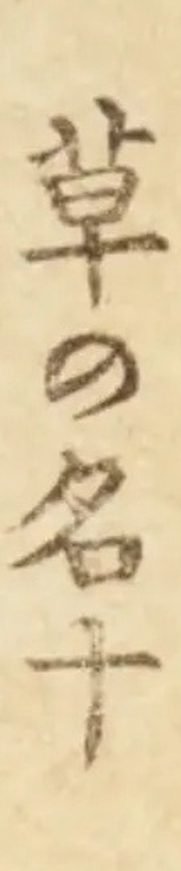草の名十
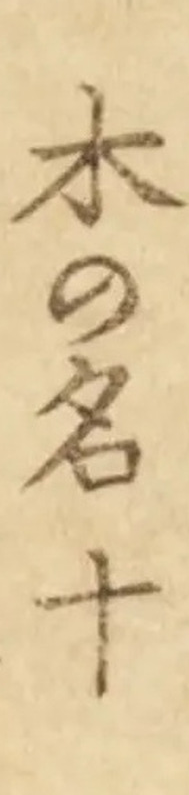木の名十
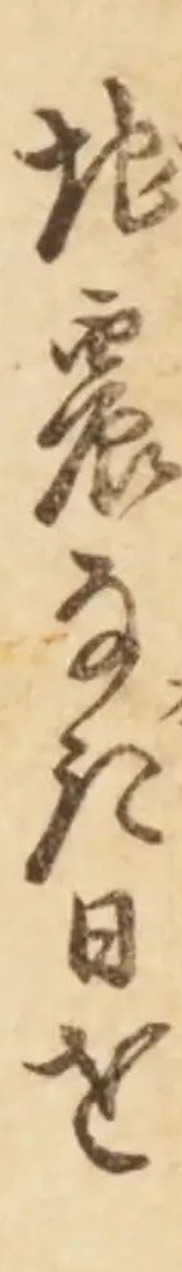地震なき日を
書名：地震用心の歌
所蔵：国立国会図書館 National Diet Library, JAPAN
